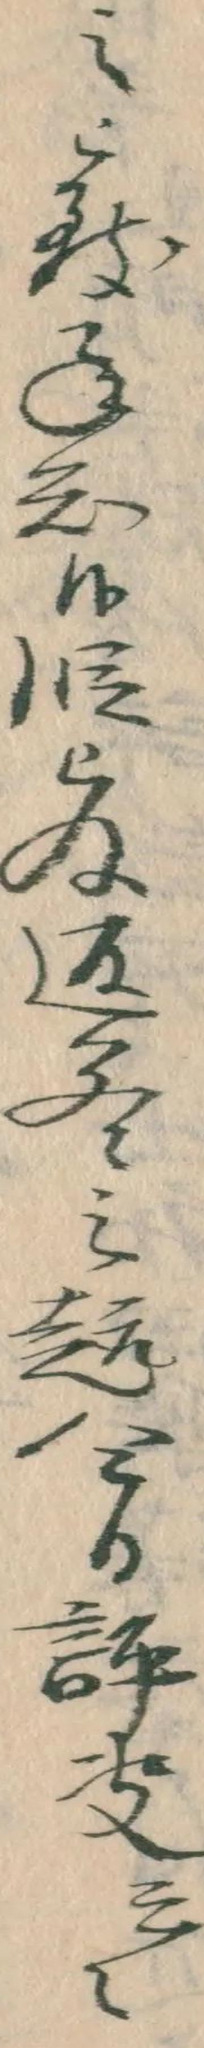之被致承知候段被及返答之趣今日評決云々
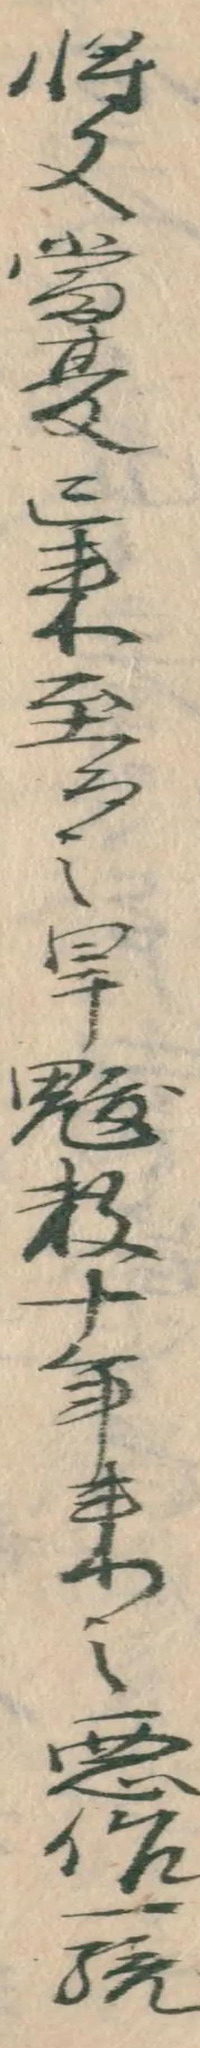将又当夏已来至而之旱魃数十年来之悪作一統
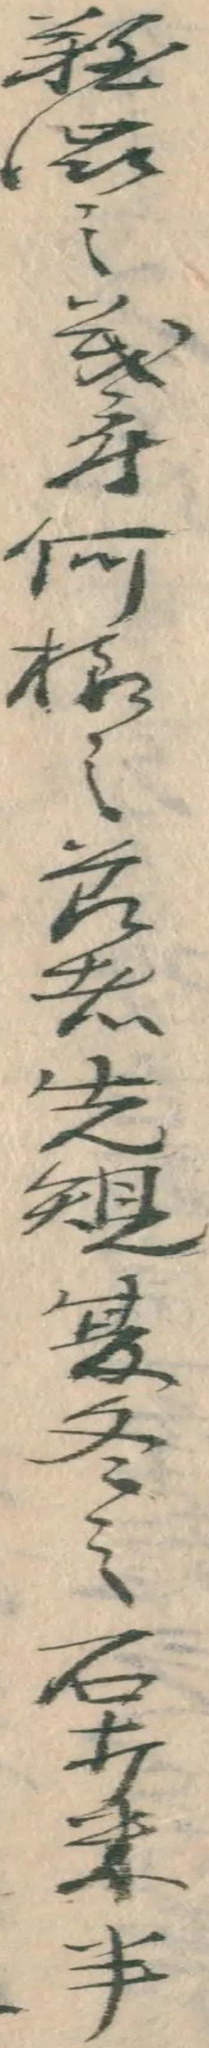難渋之義ニ付何様之節者先規夏冬之石打米半
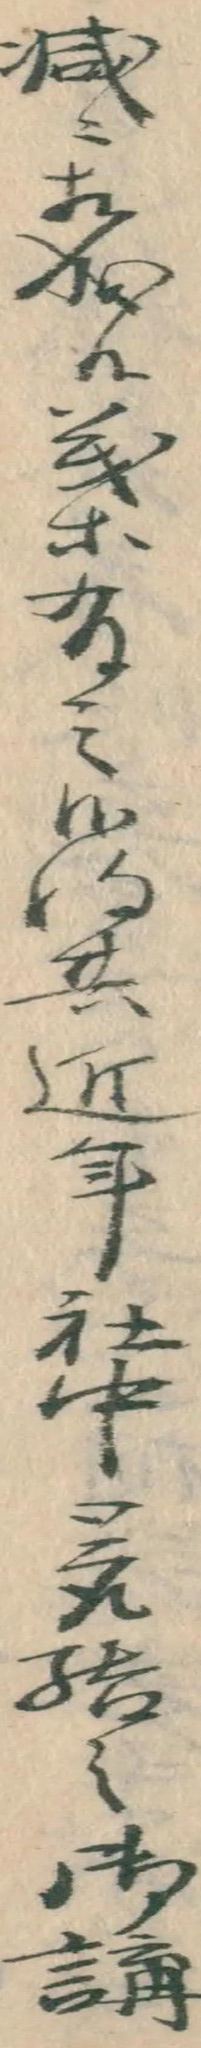減ニ相成候義等有之候得共近年社中御取結之御講
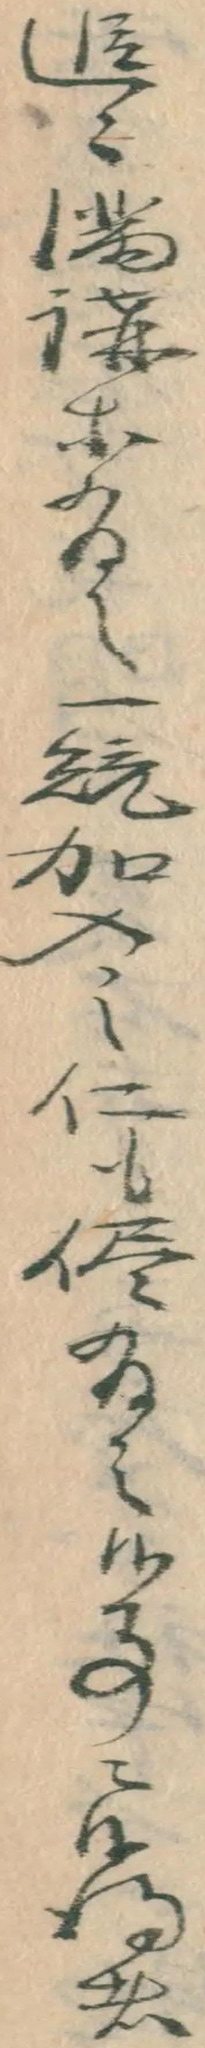追々満講等有之一統加入之仁も侭有之候事ニ候得者

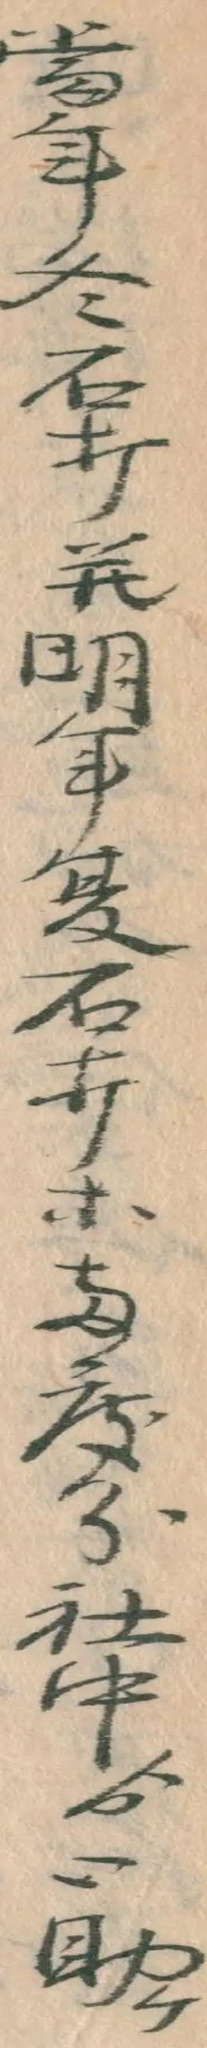当年冬石打并明年夏石打等両度分社中ゟ御助ヶ
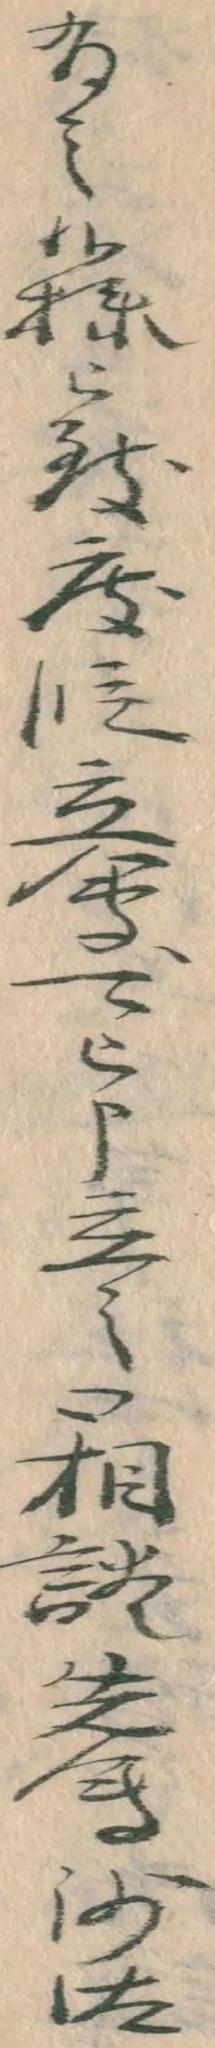有之候様被致度段立会へ可被申立之御相談先会沙汰
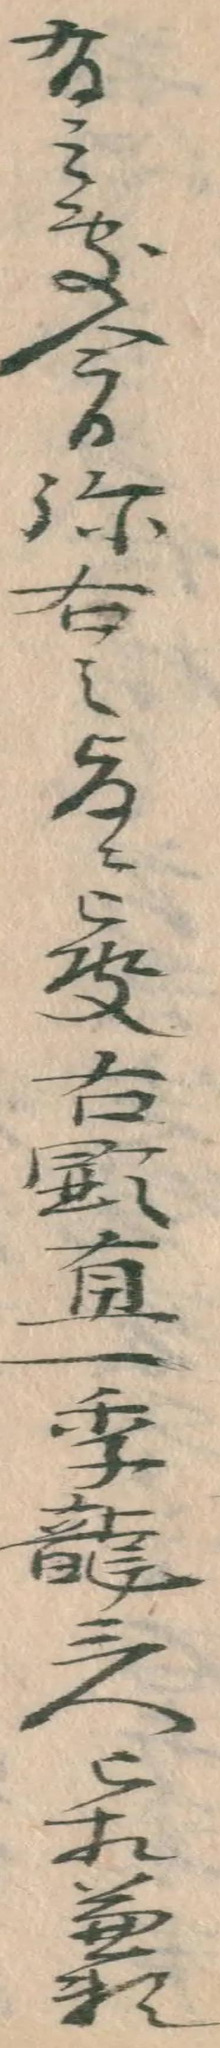有之処今日弥右之旨ニ被決古顕直一季龍三人被相兼頼
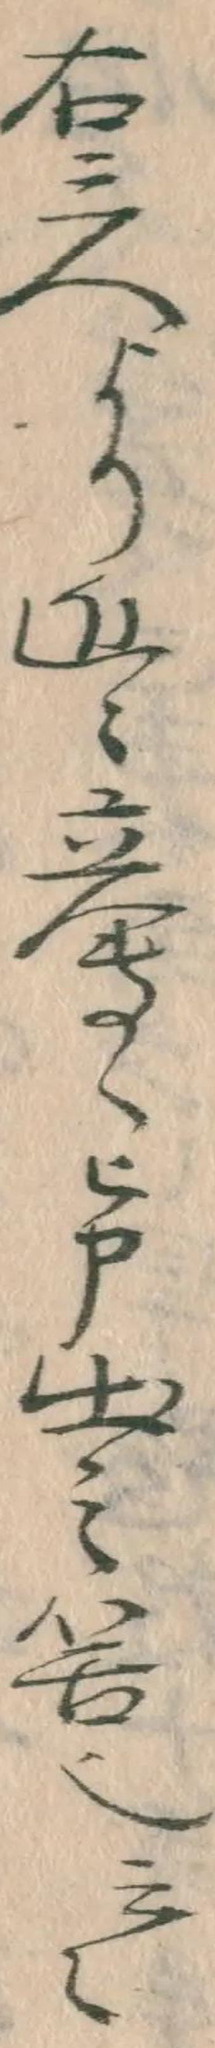右三人より近々立会へ被申出之筈也云々
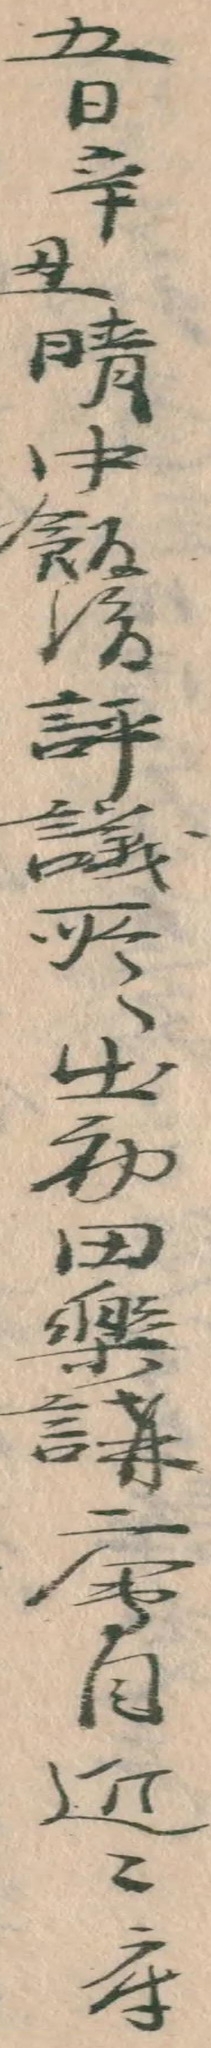五日辛丑晴中飯後評議所へ出勤田楽講二会目近々ニ付
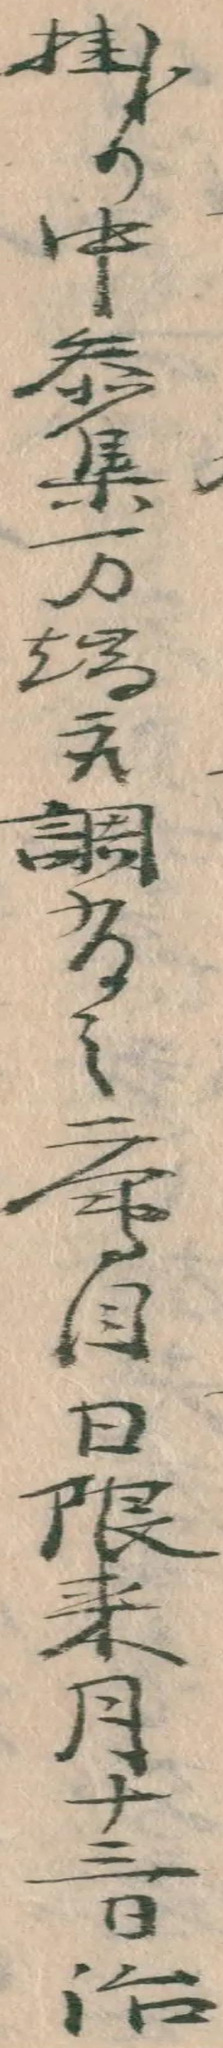掛り中参集万端取調有之二会目日限来月十三日治
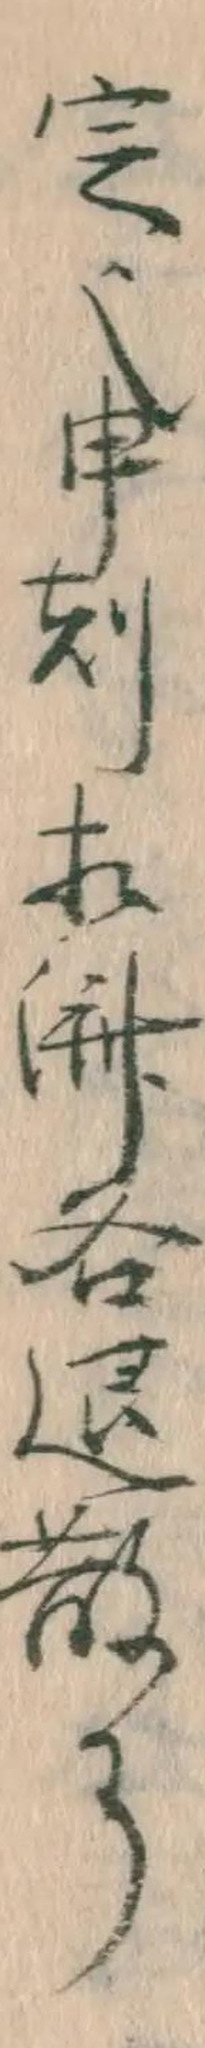定也申刻相済各退散了
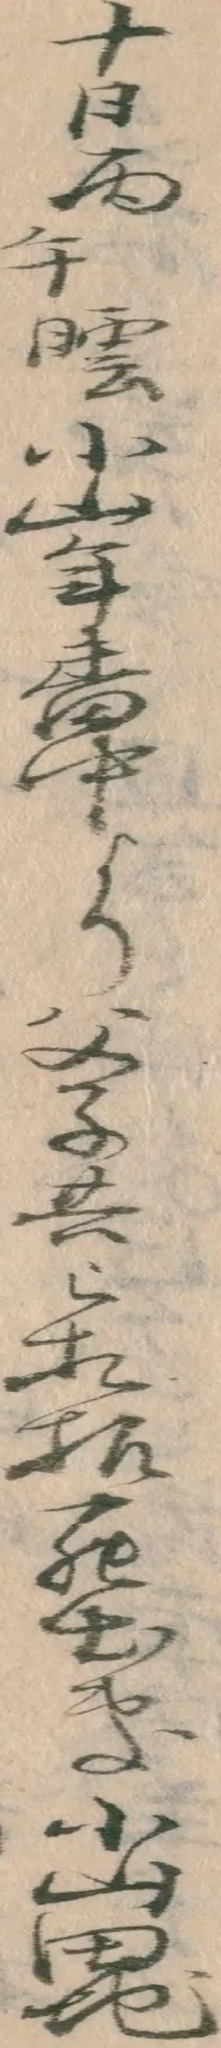十日丙午雲小山年番中より父子共被相招罷出処小山田地
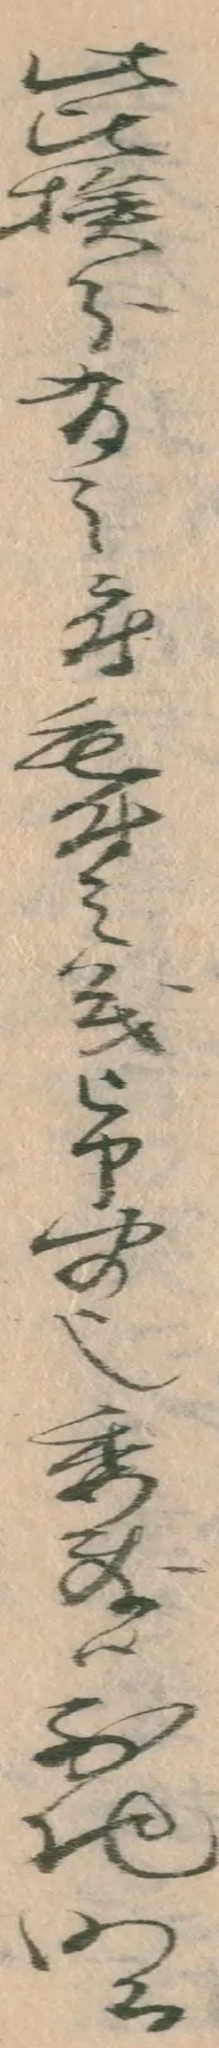此比検分有之ニ付毛付之義被申聞也委敷ハ別記仍而
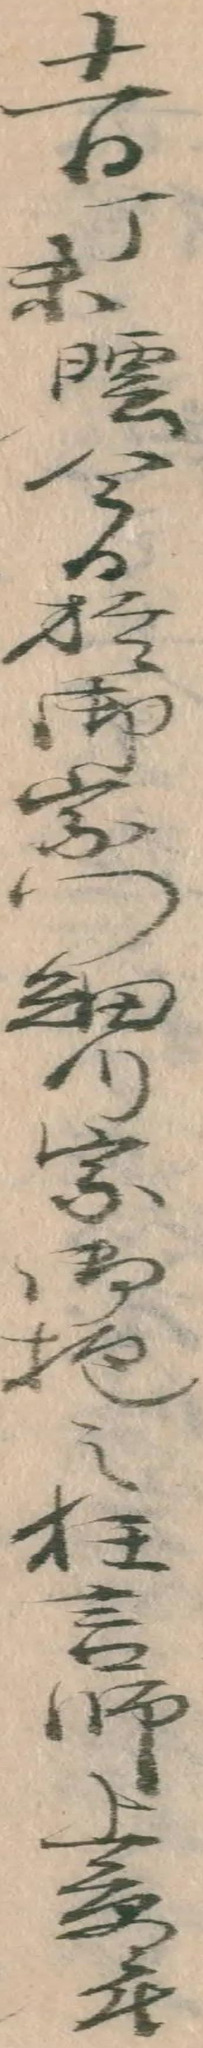十一日丁未曇今日於御家門細川家御抱之狂言師上京ニ付
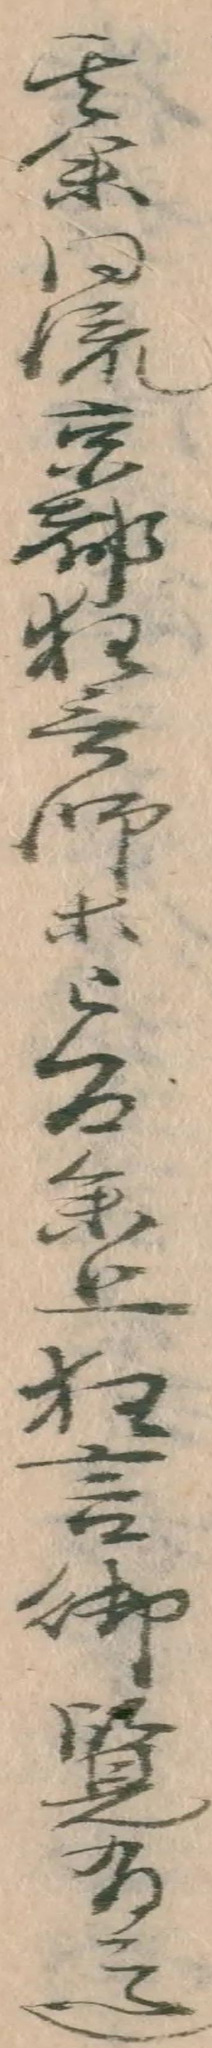其余同流京都狂言師等被召参上狂言御覧有之也
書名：賀茂社記録. 第64冊
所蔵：国立国会図書館 National Diet Library, JAPAN
